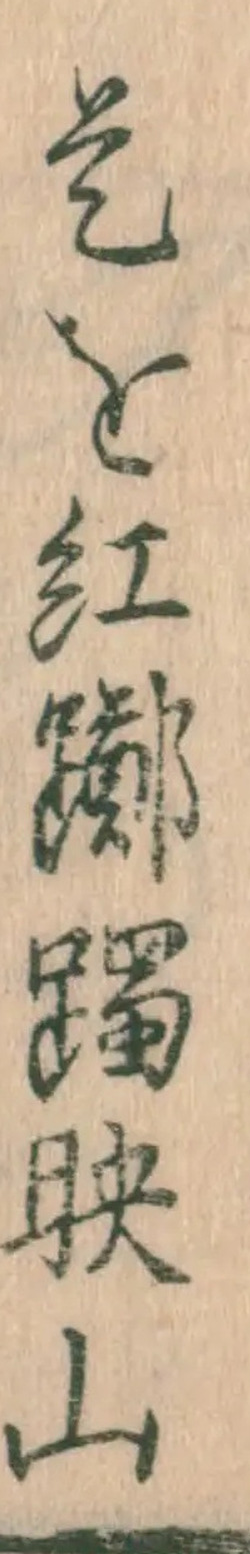是を紅躑躅映山
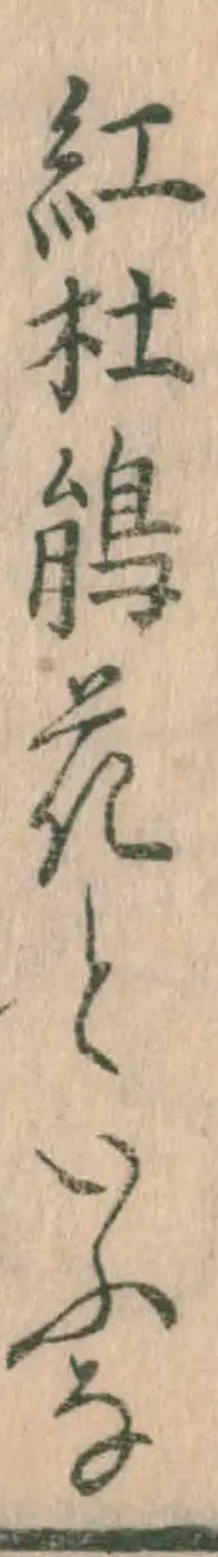紅杜鵑花といふな
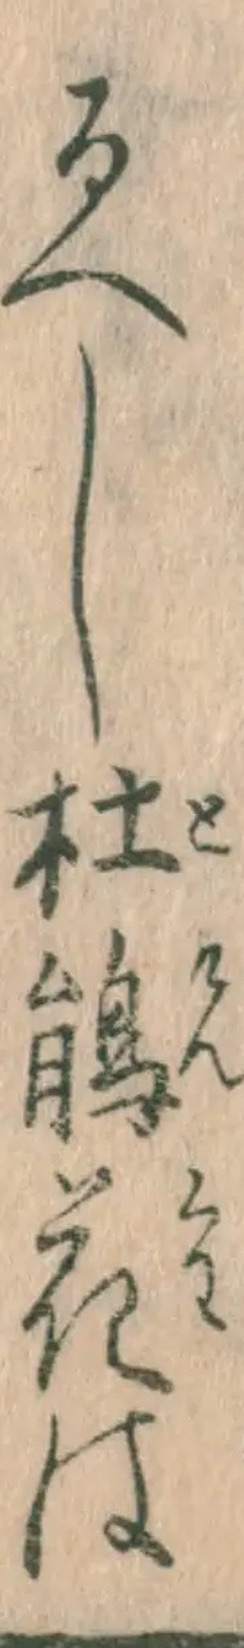るへし杜鵑花は
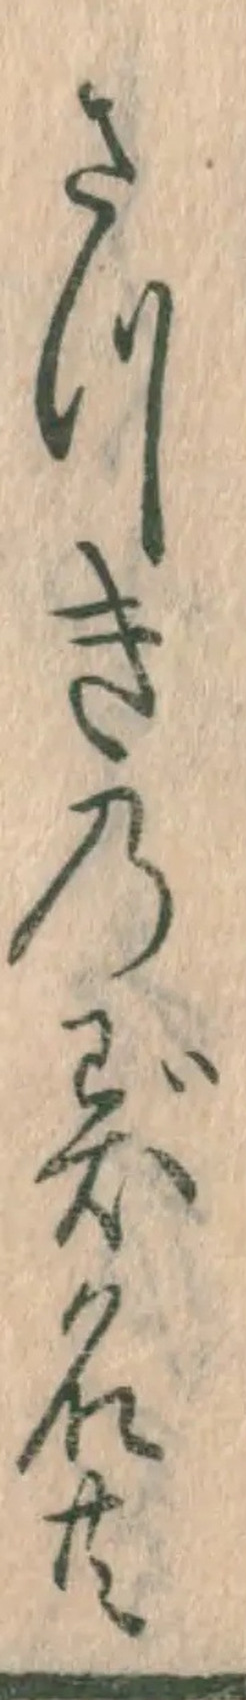さつきの異名共
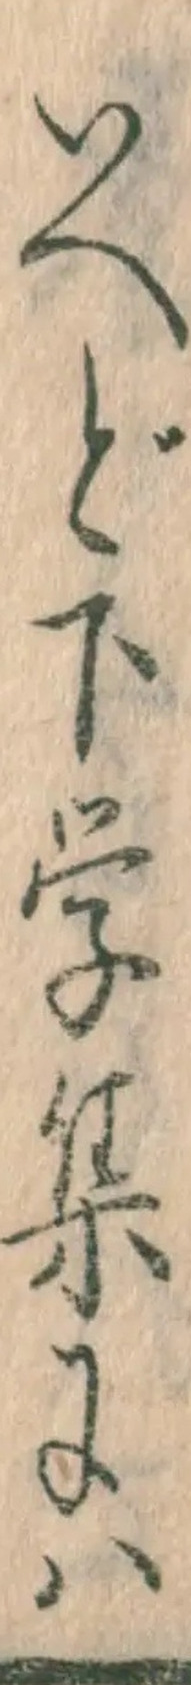いへど下学集には
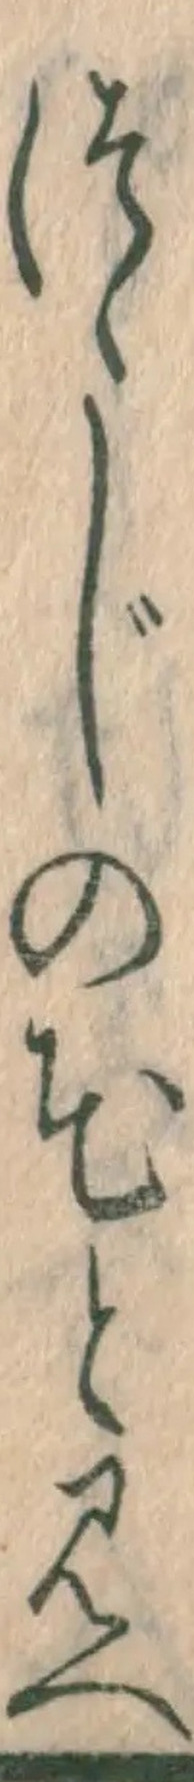つゝじの花と見へ
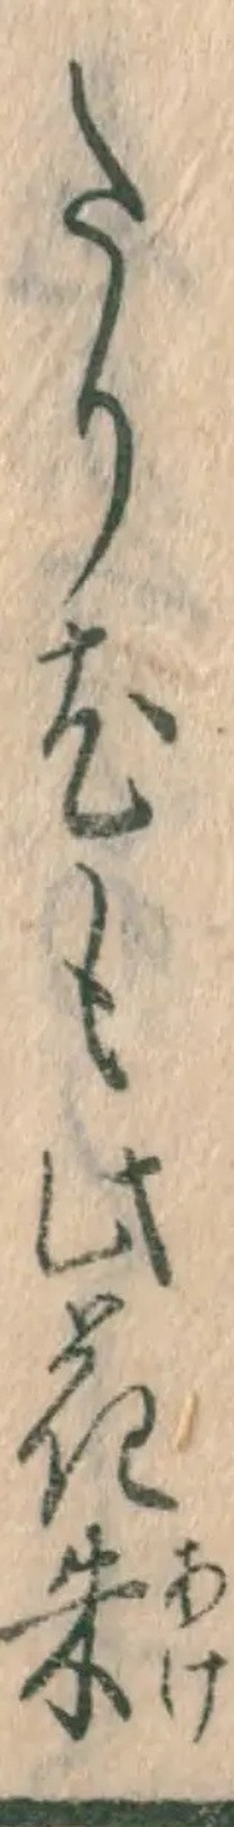たり花も此花朱
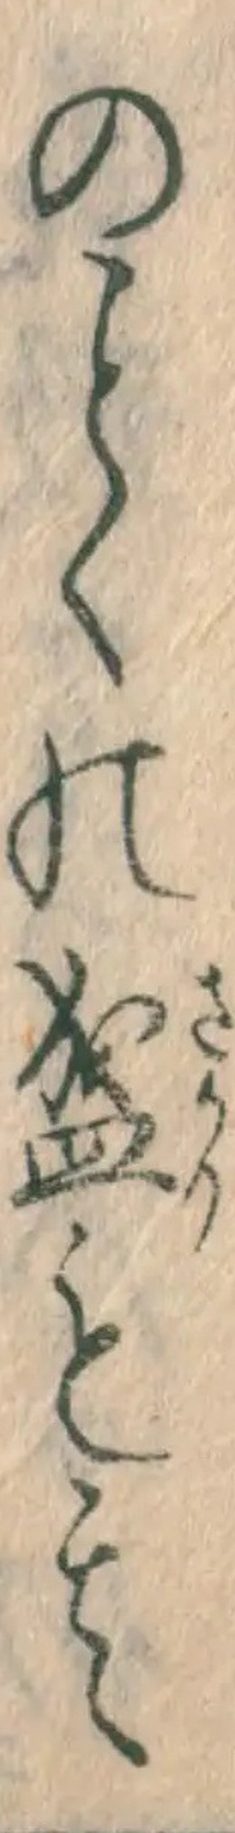のことくの盛も其
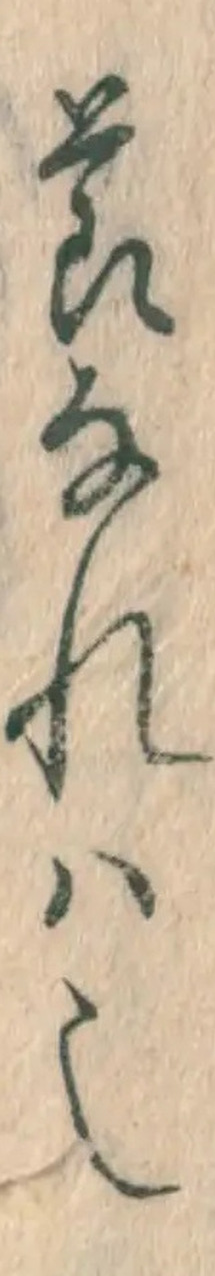節なれは也

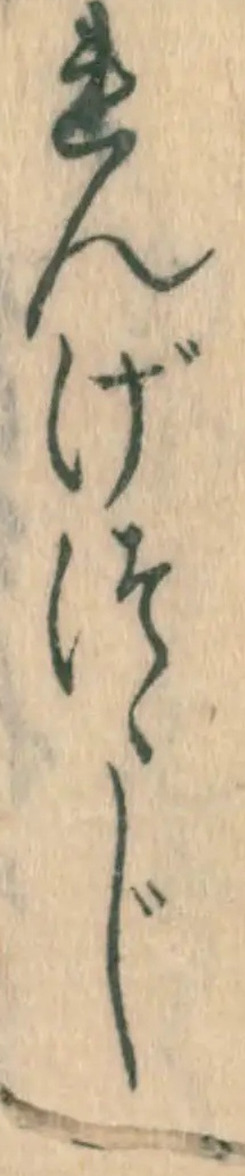▲れんげつゝじ
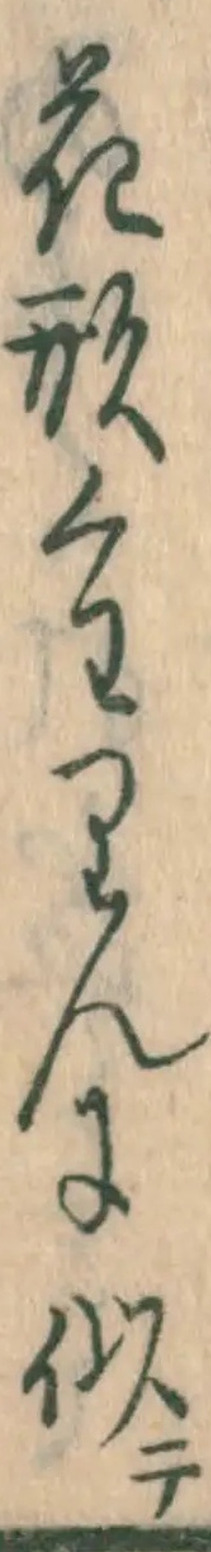花形くわりんに似
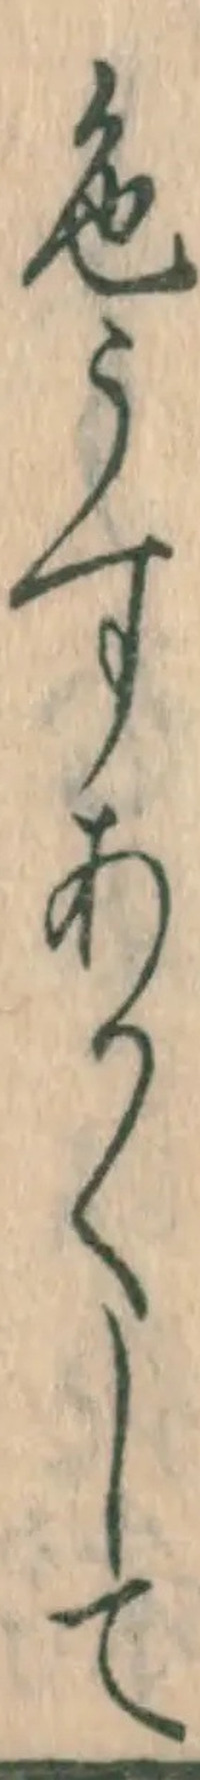色うすあかくして
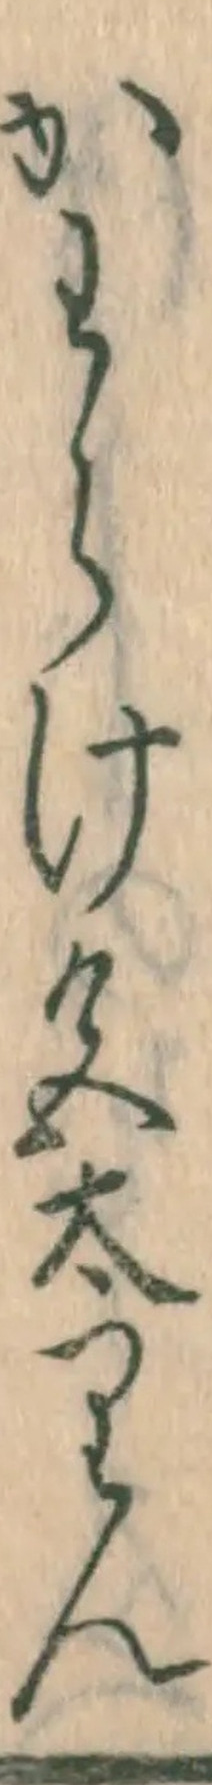かわらけ色太りん
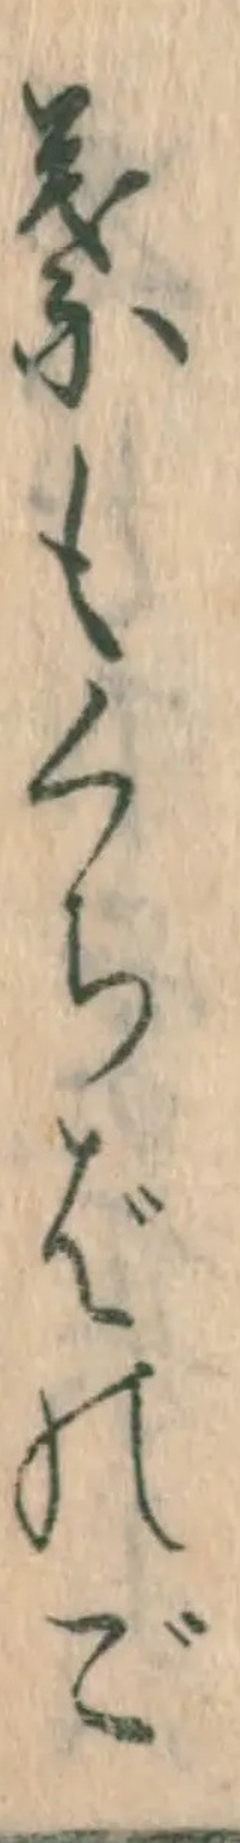葉もくちばのご
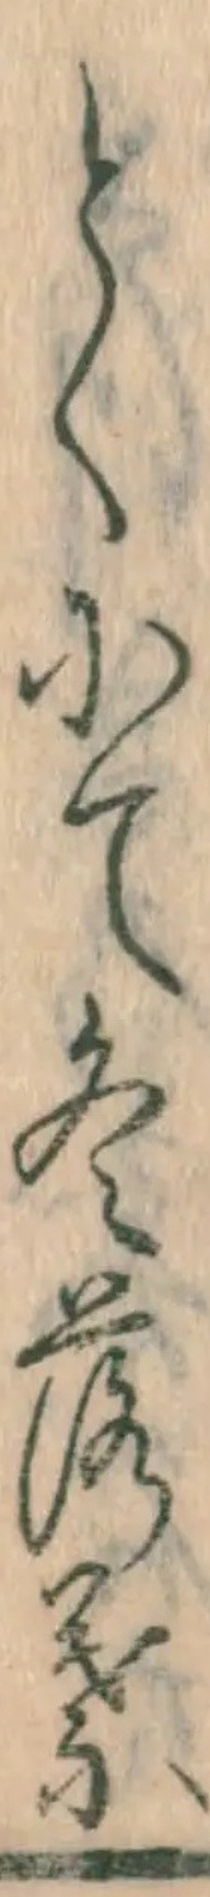とくにて冬落葉
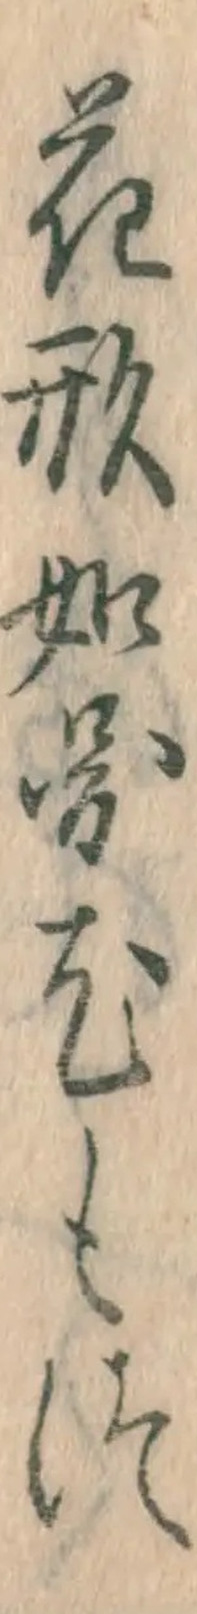花形如図花もつ
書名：錦繍枕 5巻. [3]
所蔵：国立国会図書館 National Diet Library, JAPAN
